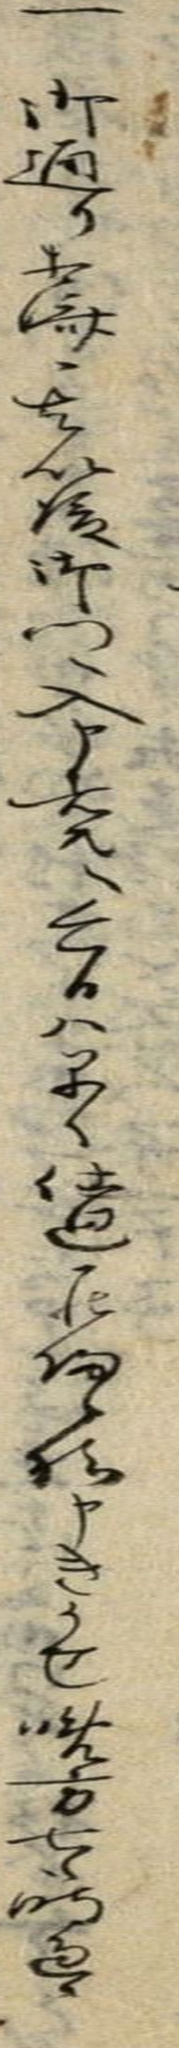一御通り相済其以後御門へ入申共へ今日は早々仕廻罷帰候様申きかせ晩方七ツ時過候
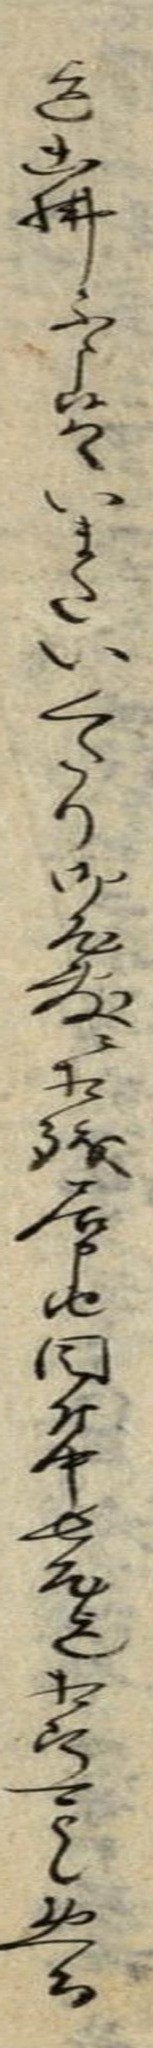迄出払不申候はゝいまたいくたり御屋敷に相残居申由目付中長屋迄相断可申候惣て
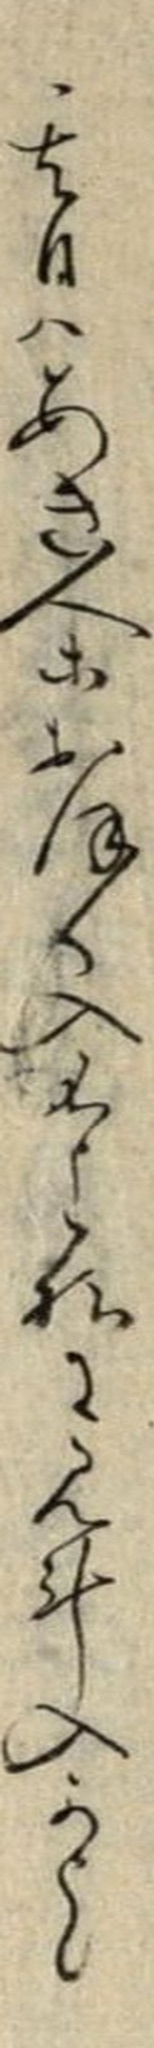其日はあき人等おほく入不申候様に見計入可申候
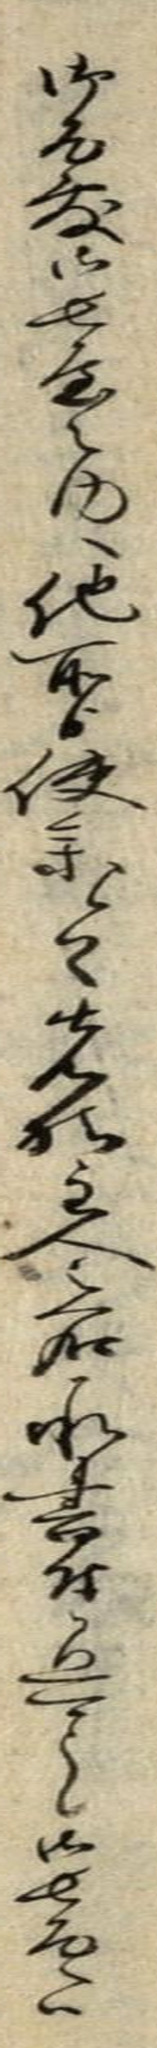一御屋敷御長屋之内へ他所ゟ使参候はゝ先様主人之所承書付置可申候御長屋へは
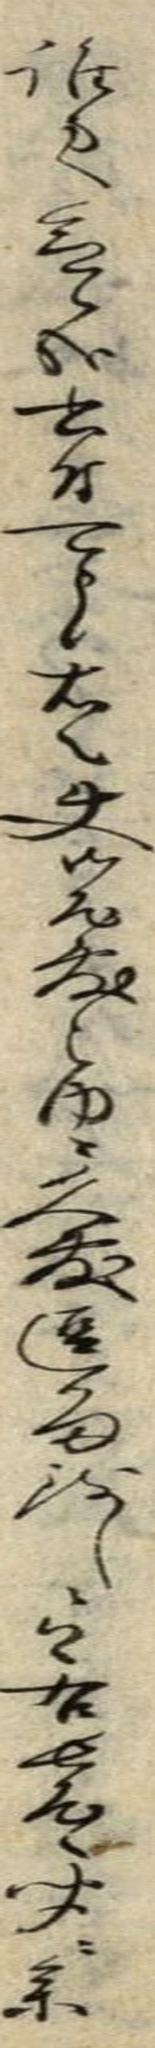誰方へ参候哉書付可申候右之使御屋敷之内に久敷逗留致し候はゝ右長屋へ聞に参
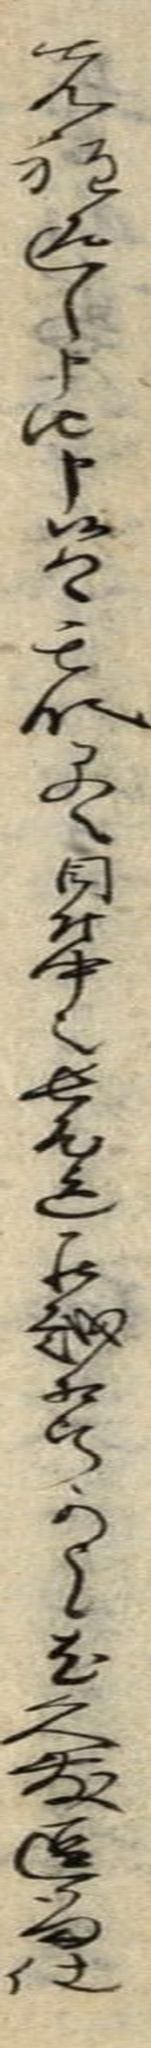先程返し申由申候はゝ其段早々目付中之長屋迄罷越相断可申候尤久敷逗留仕
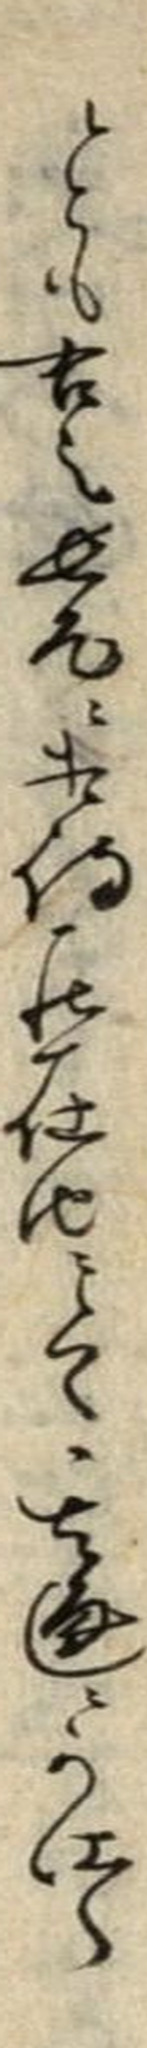候とも右之長屋に相待罷在由に候はゝ其通に可仕候
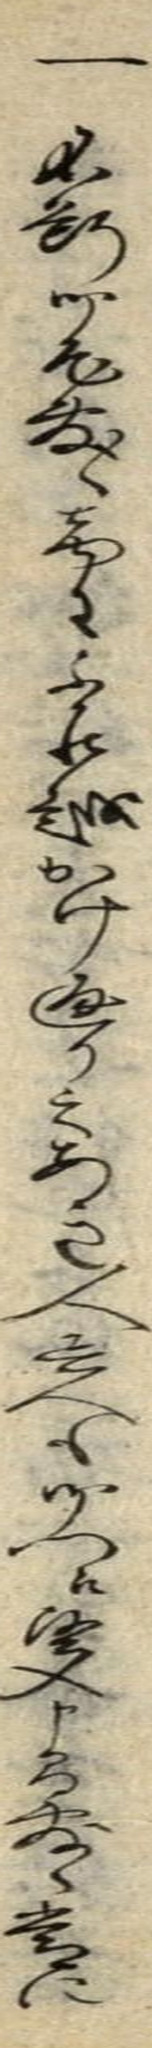一不断御屋敷へ商に不罷越かけ通り之あき人壱人も御門江堅入申間敷候常に
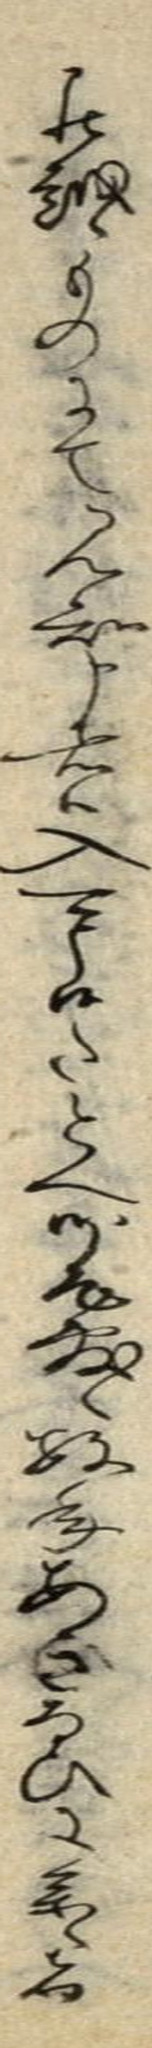罷越候ものにて見知申者は入可申候たとへ御屋敷へ数年あきなひに参候者
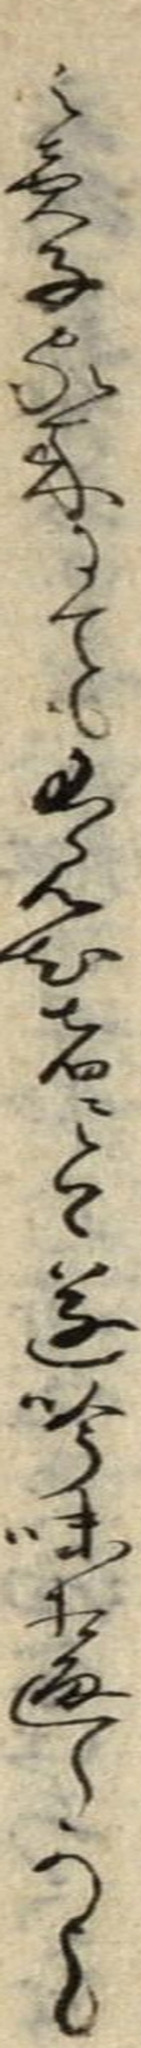之売子家来にても不見知者に候はゝ遂吟味相通し可申候
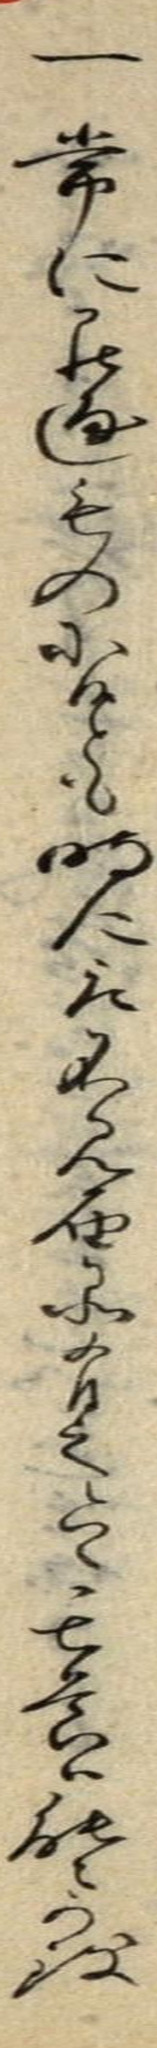一常に罷通ものに候とも時に取不見届品有之候はゝ其節は能々可致

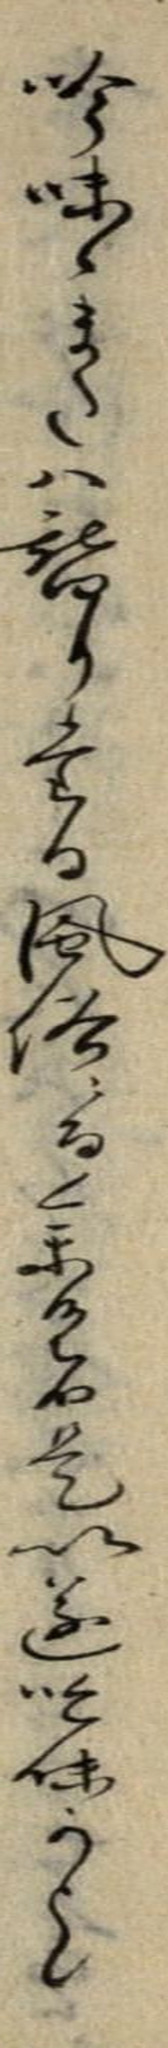吟味候または替りたる風俗にて参候者是以遂吟味可申候
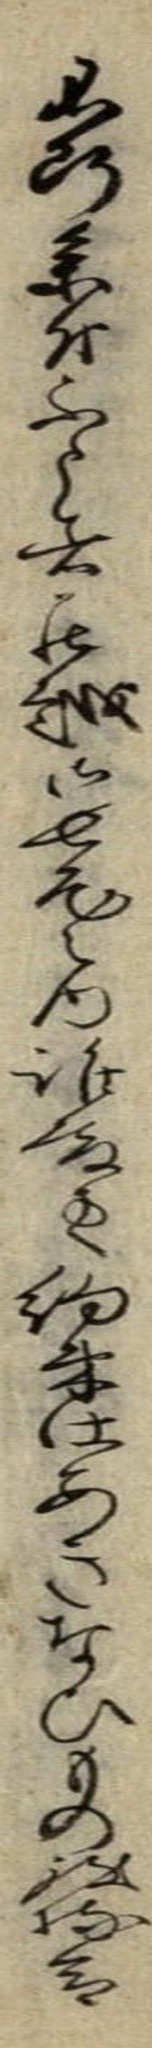一不断参付不申者罷越御長屋之内誰殿方へ約束仕あきなひもの致持参
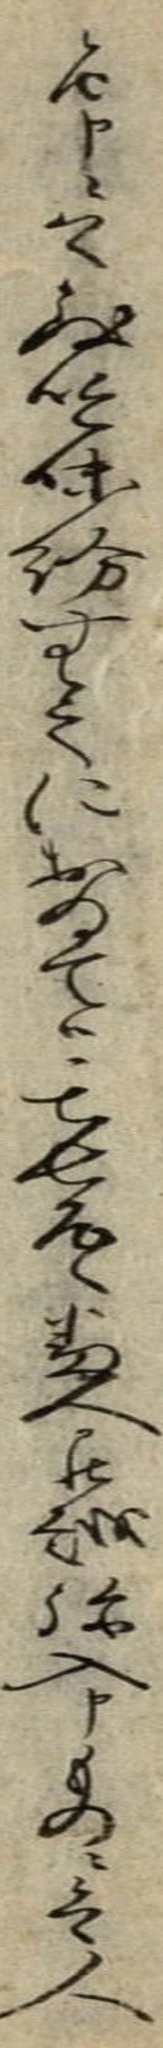候由申候はゝ致吟味紛無之におゐては其長屋へ番人罷越弥入申ものに候はゝ人
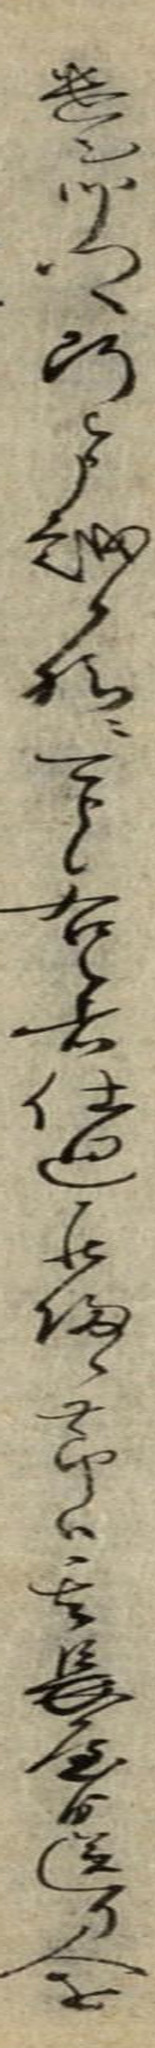遣し御門へ断被申越候様に可申候右之者仕廻罷帰候其節は其長屋ゟ送り人
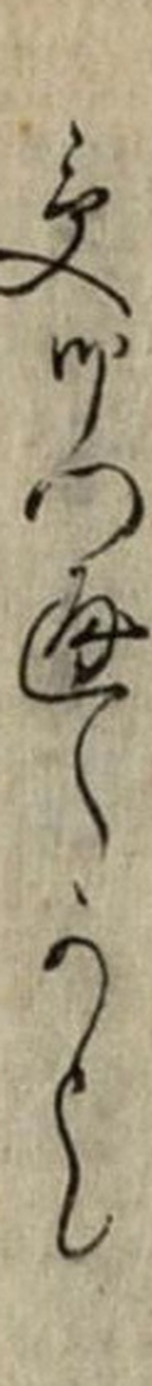受御門通し可申候
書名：三都并道中之部
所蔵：福井県文書館 Fukui Prefectural Archives
